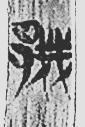{戔阝}
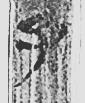子
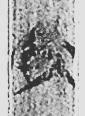安
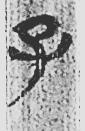子
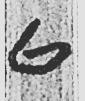㠯（以）
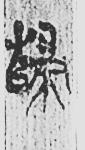{𡴎帚}
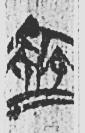齊
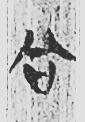冋
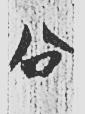公
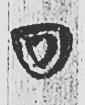回
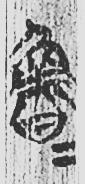魯=
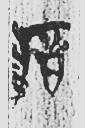{爿言}
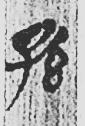孫
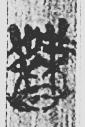{無日}
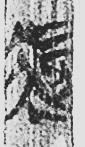{辶石}
